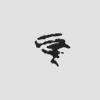𠭁
